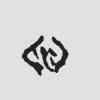𣶒
